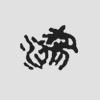湯
